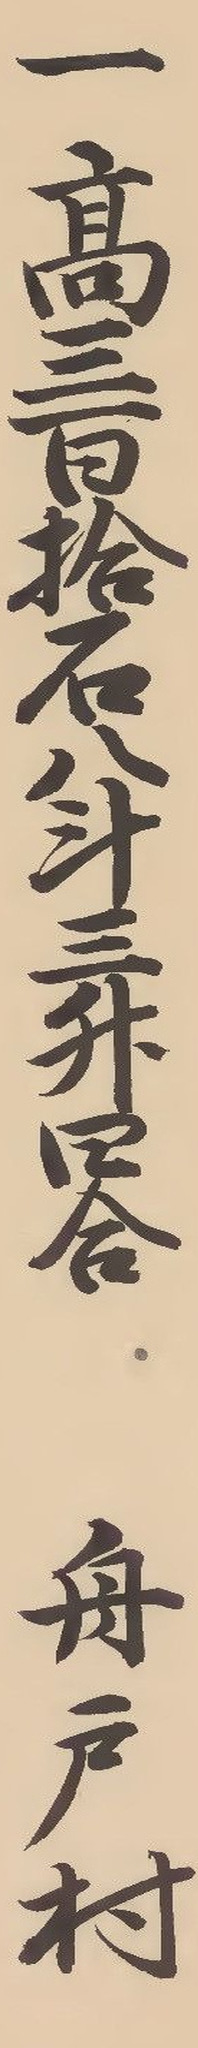一高三百拾石八斗三升四合舟戸村
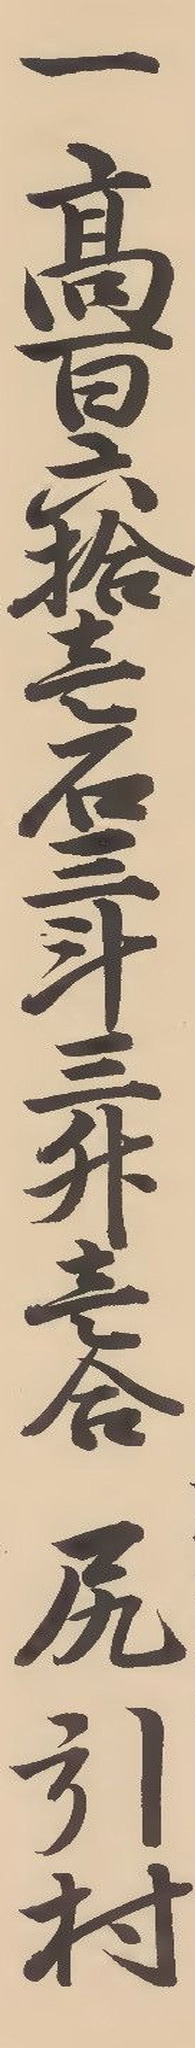一高百六拾壱石三斗三升壱合尻引村
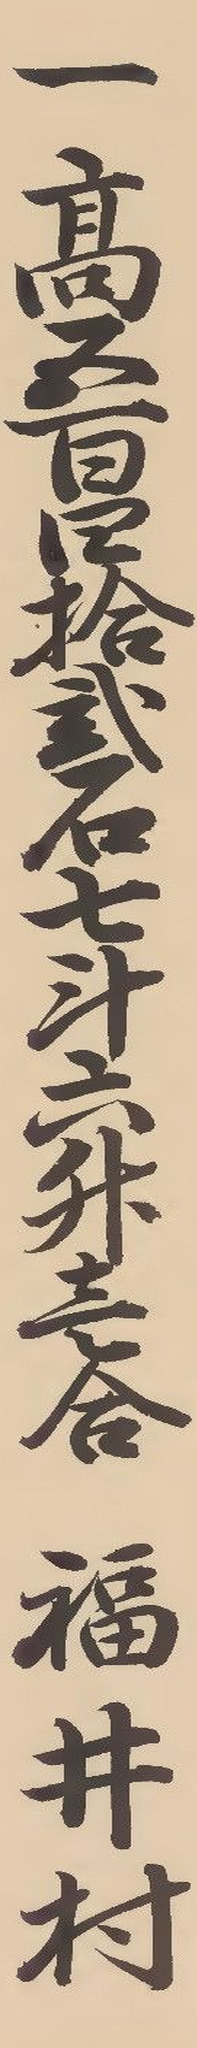一高五百四拾弐石七斗六升壱合福井村
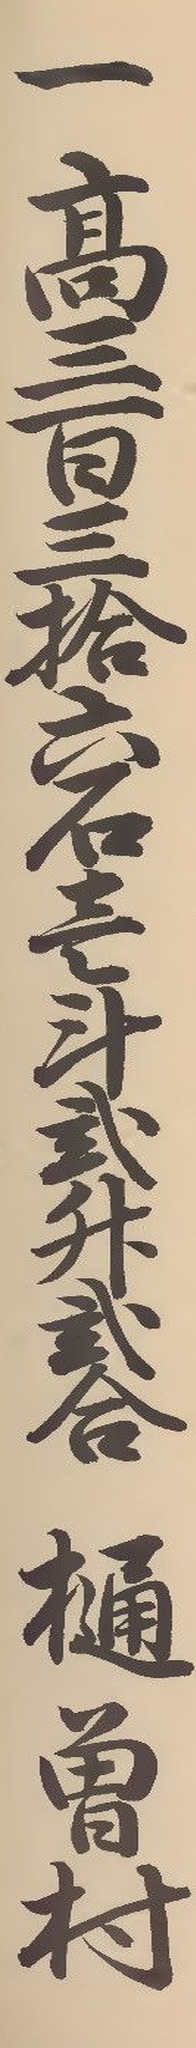一高三百三拾六石壱斗弐升弐合樋曽村
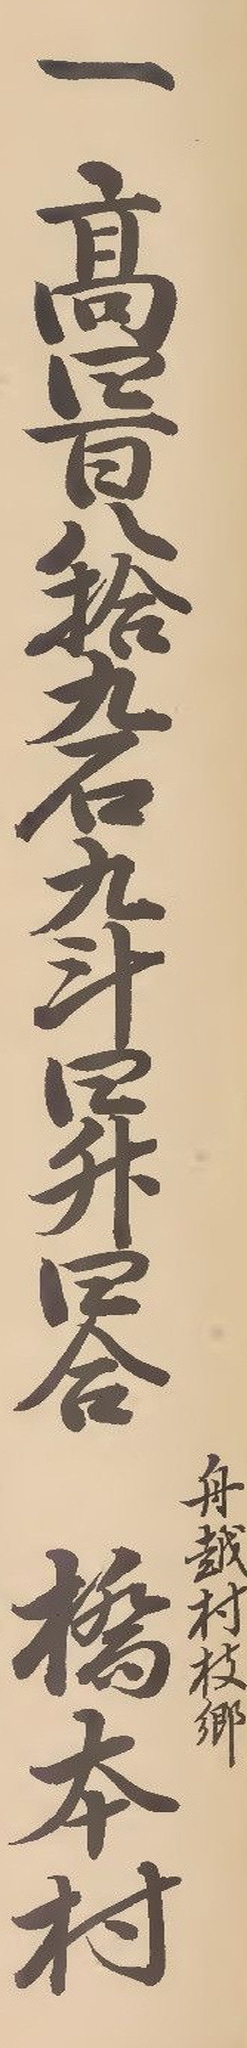一高四百八拾九石九斗四升四合橋本村
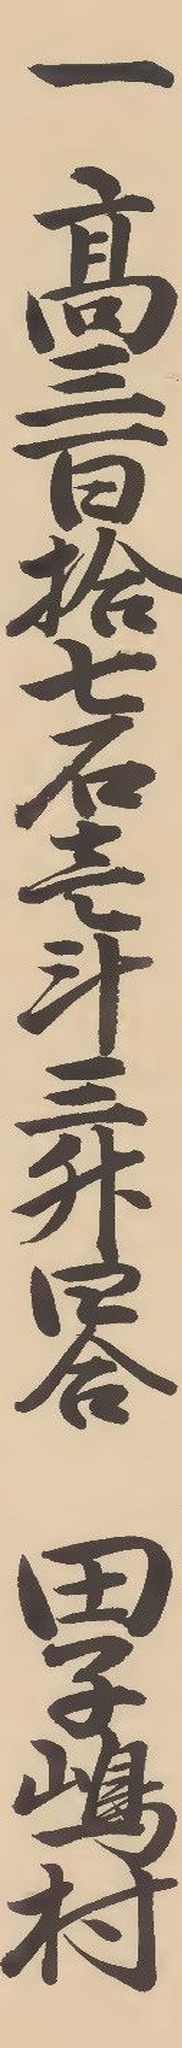一高三百拾七石壱斗三升四合田子島村
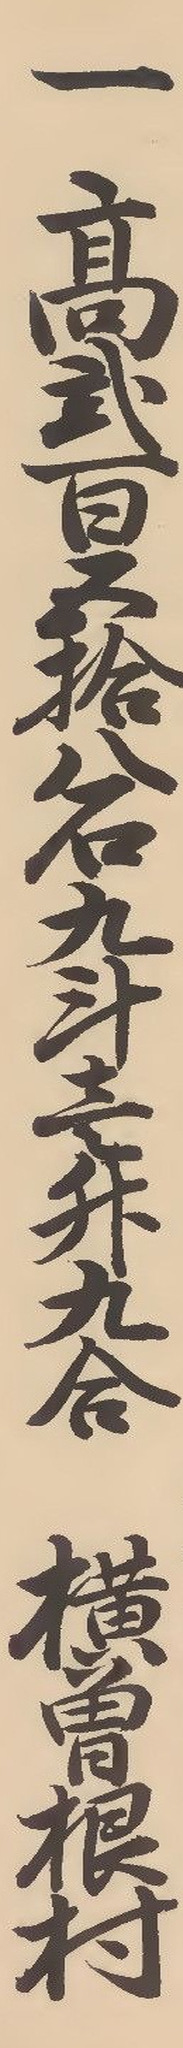一高弐百五拾八名九斗壱升九合横曽根村
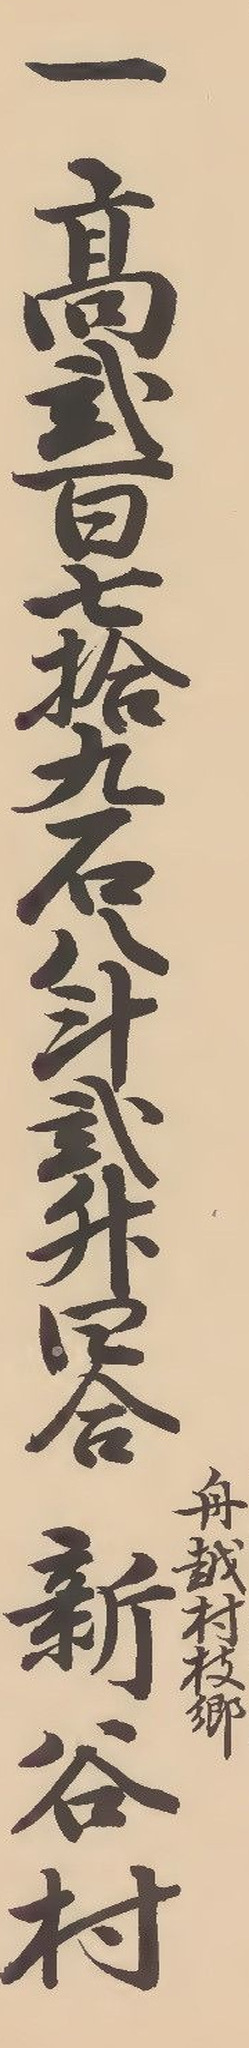一高弐百七拾九石八斗弐升四合新谷村

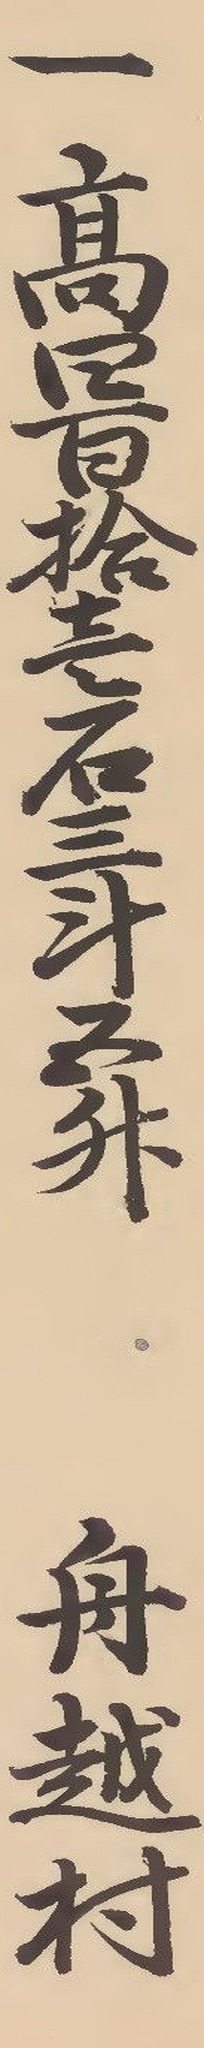一高四百拾壱石三斗五升舟越村
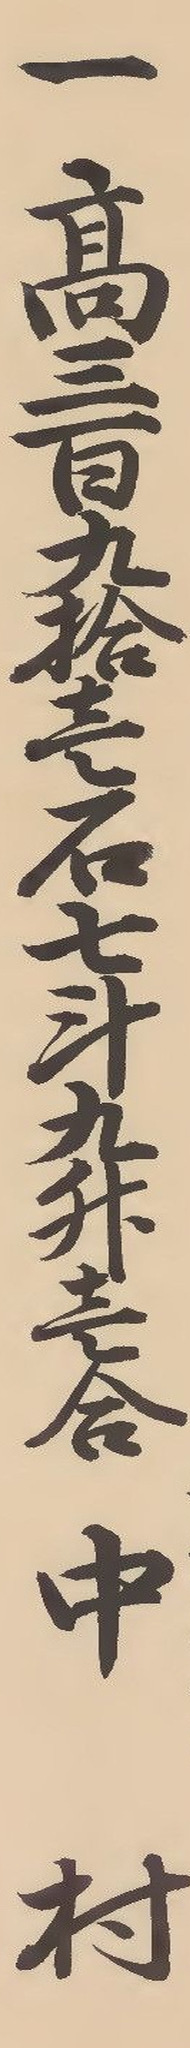一高三百九拾壱石七斗九升壱合中村
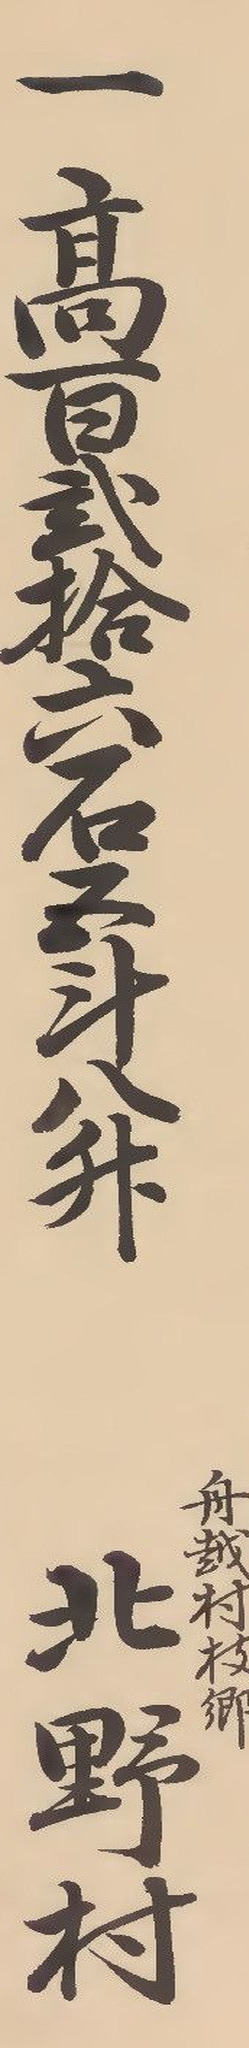一高百弐拾六石五斗八升北野村
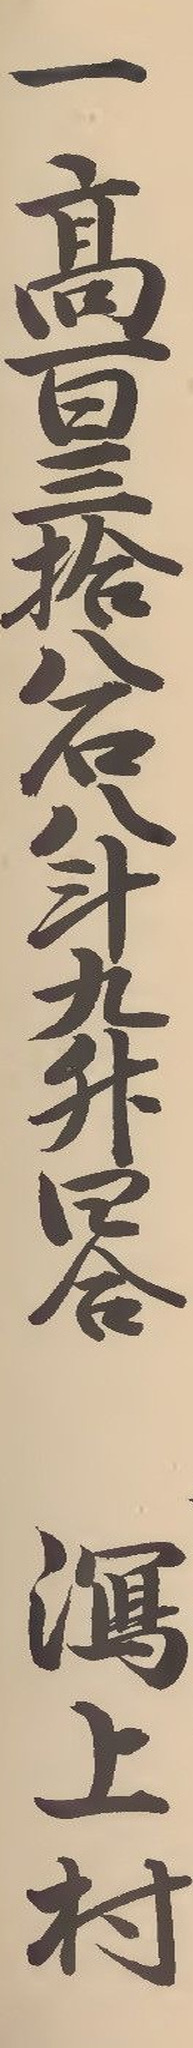一高百三拾八石八斗九升四合潟上村
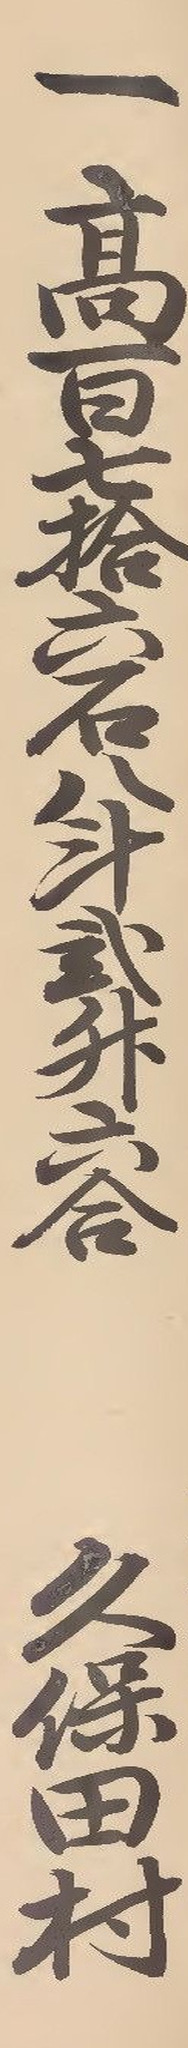一高百七拾六石八斗弐升六合久保田村
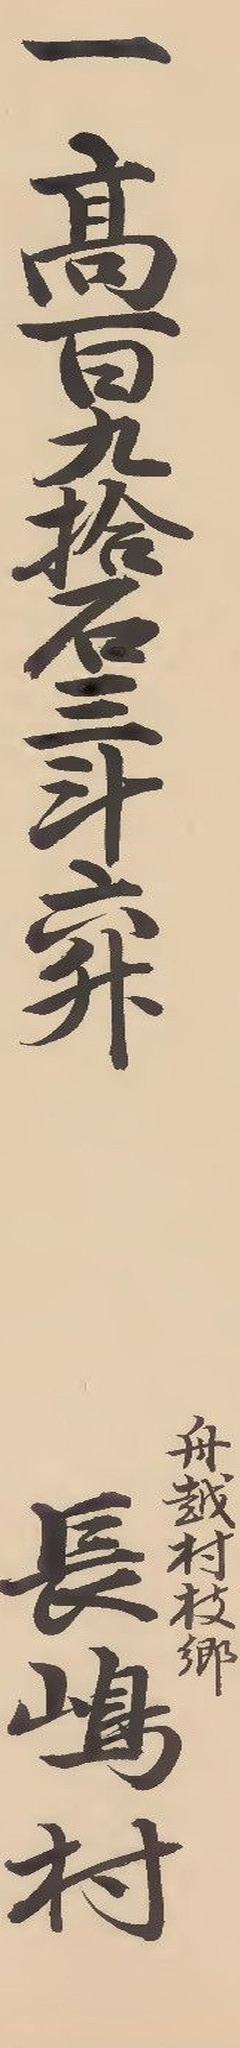一高百九拾石三斗六升長島村
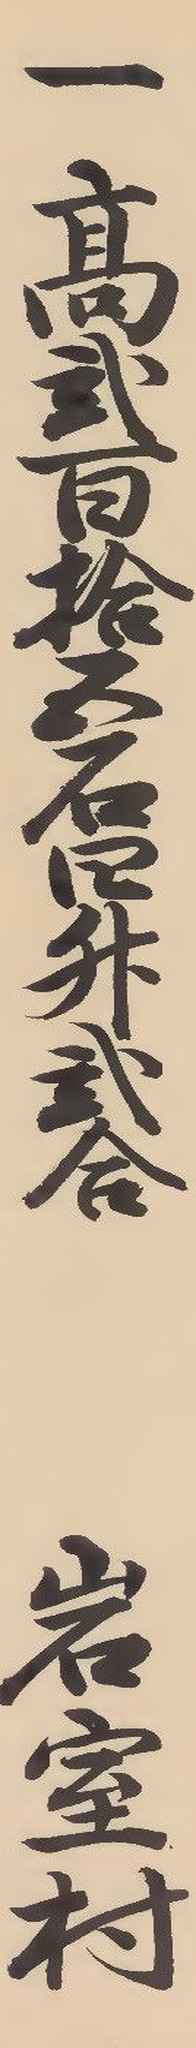一高弐百拾五石四升弐合岩室村
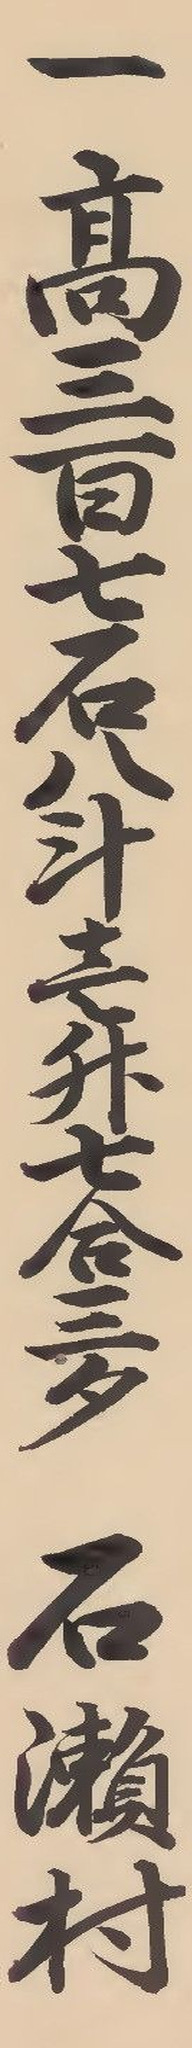一高三百七石八斗壱升七合三勺石瀬村
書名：越後国郷帳　下
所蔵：国立公文書館 National Archives of Japan
